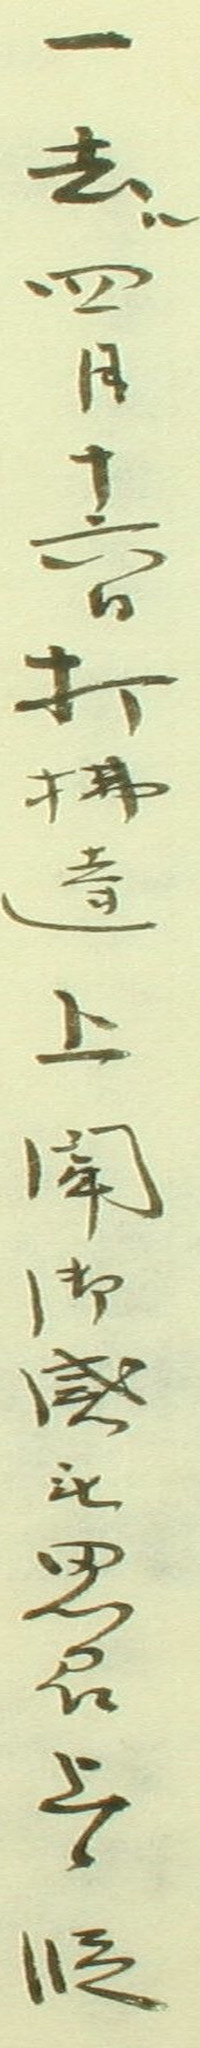一去る四月十六日打払違上聞御感被思召上候段
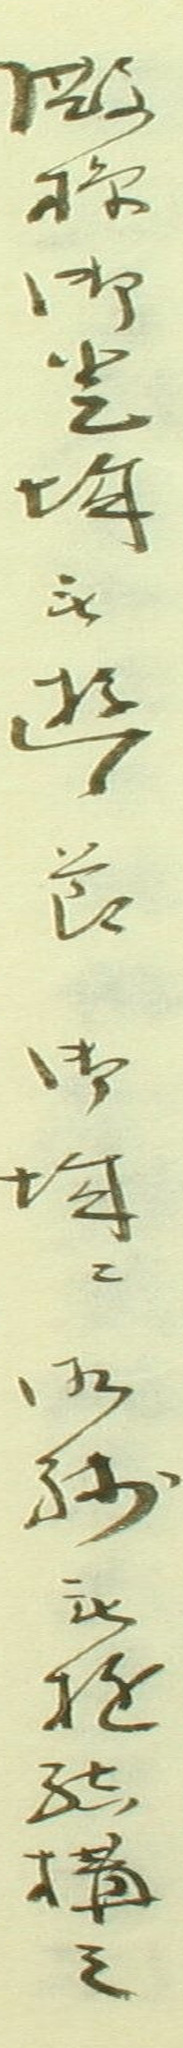殿様御登城被遊候節御城に御残被遊結構之
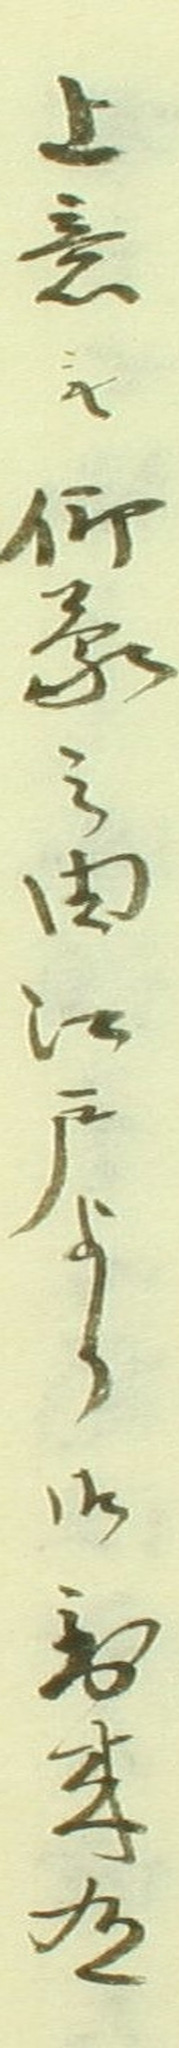上意も仰蒙之由江戸より御出来有
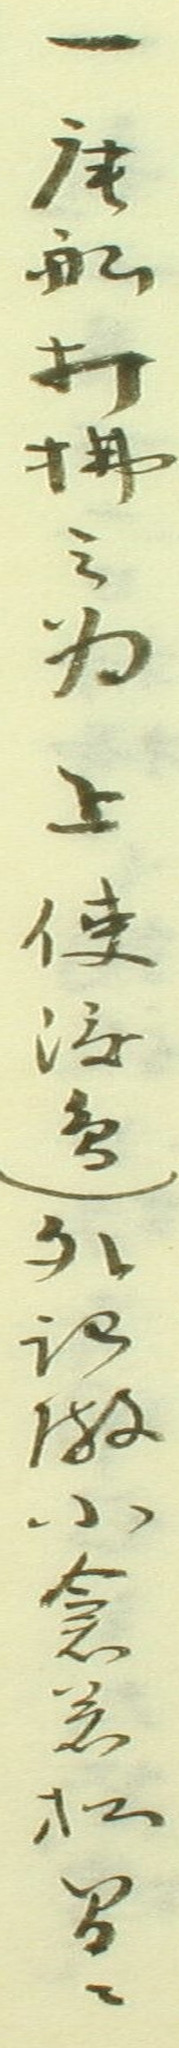一唐船打払之為上使渡辺外記殿小倉若松間に
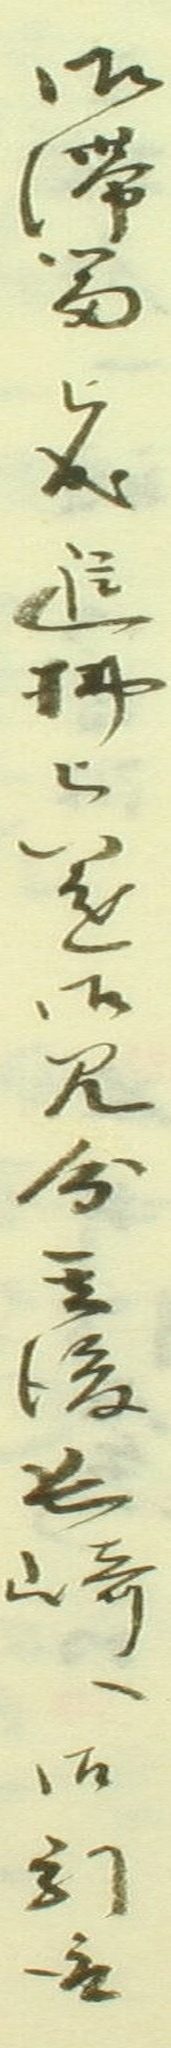御滞留被成追払被還御検分其後長崎へ御引取
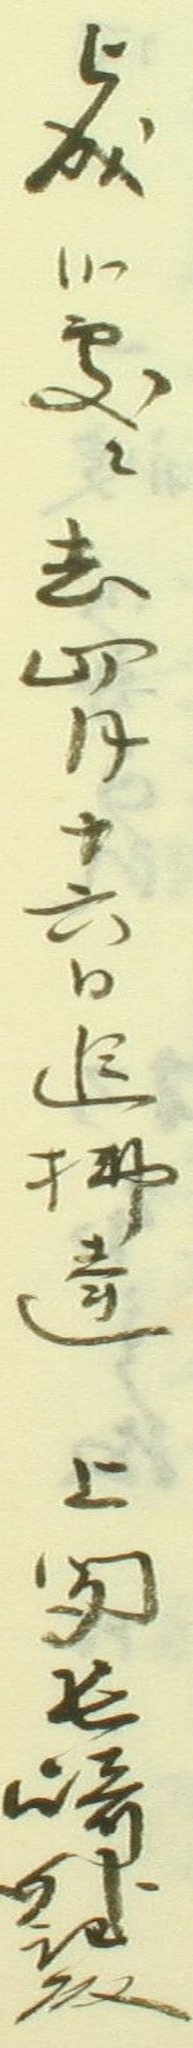被成候處に去四月十六日追払違被聞長崎外記殿
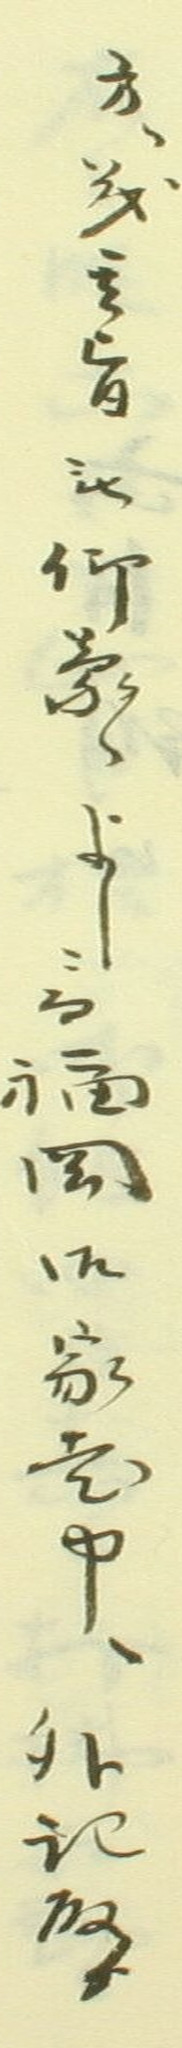方へ義其旨被仰蒙候よしに而福岡御家老申候外記殿ゟ
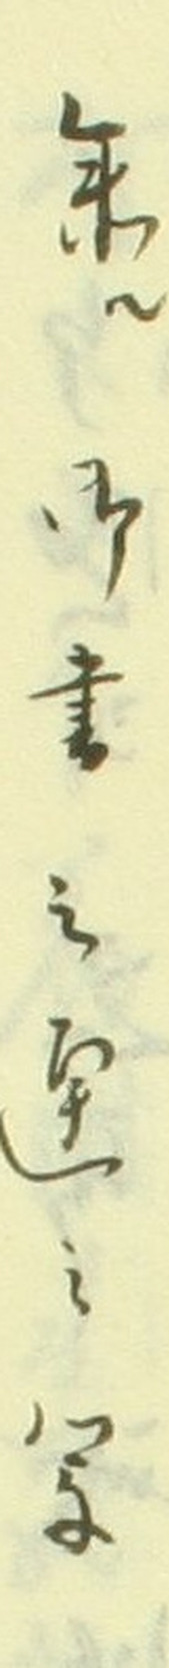参る御書之通之写
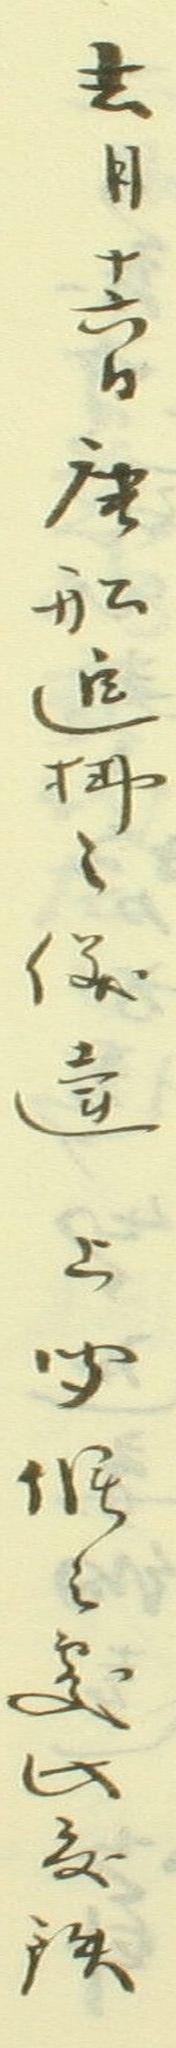去月十六日唐船追払之儀違被聞候之處此度鉄
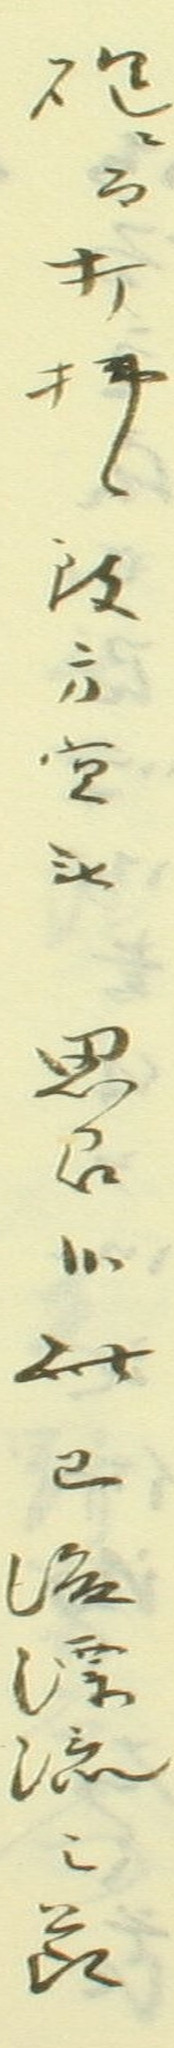砲に而打払候致方宜被思召候此己後漂流之節
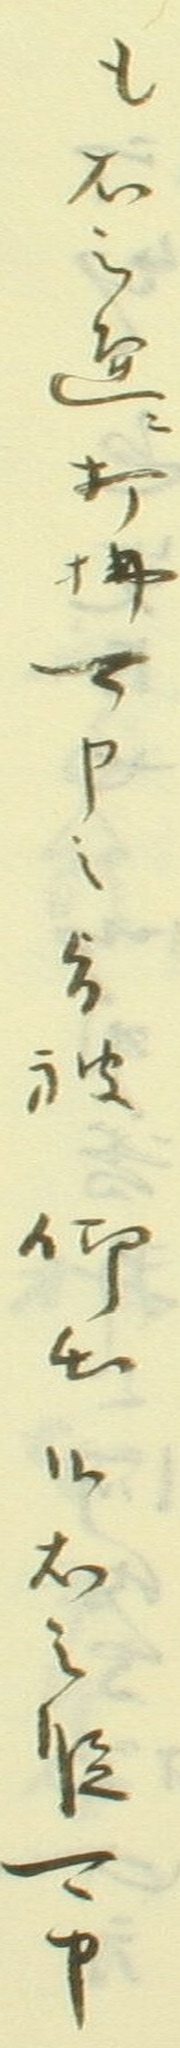も右の通に打払可申之旨被仰出候右之段可申
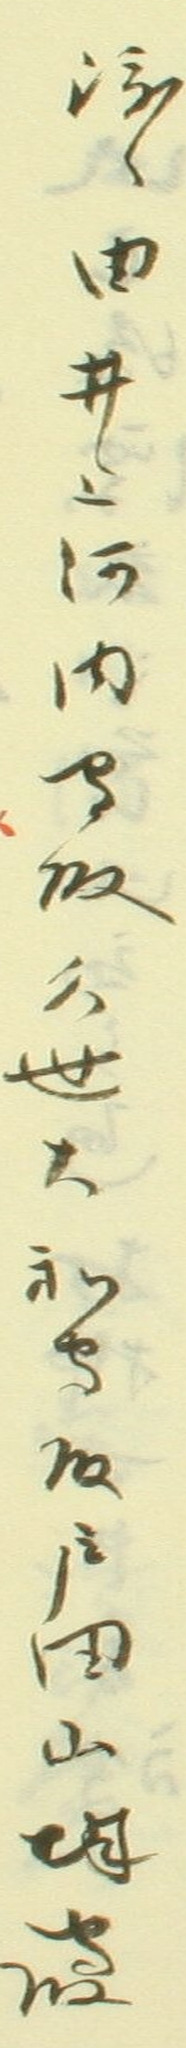浮候由井上河内守殿久世大和守殿戸田山？守殿
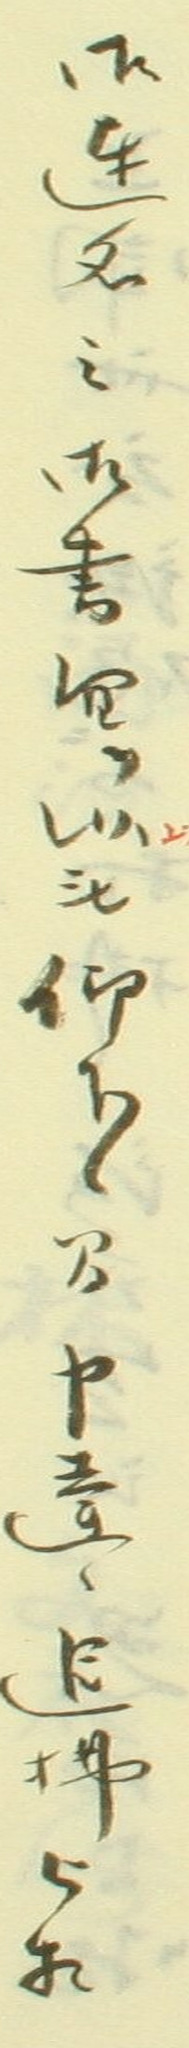御連名之御書面を以被仰下候間申違候追払被相
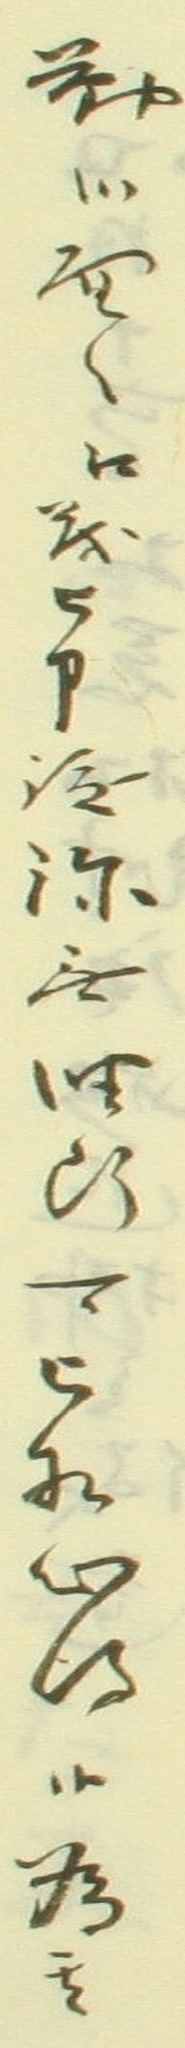勤候面々江も被申浮？無油断可被相心得候為其

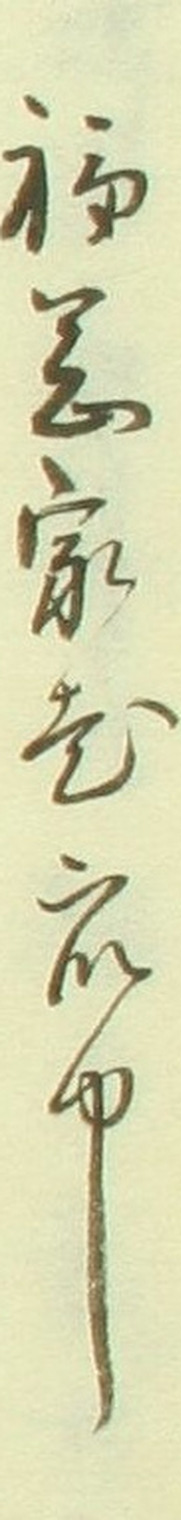福岡家老衆中
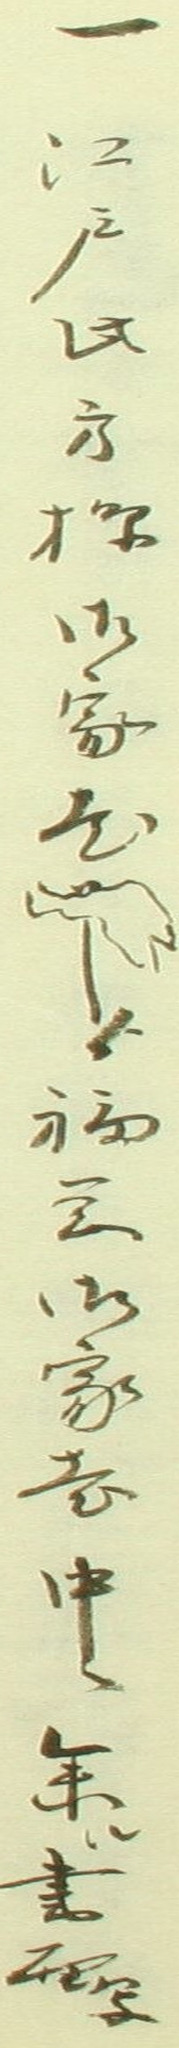一江戸此方様御家老？しゟ福岡御家老中へ参る書面写
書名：唐船漂流記 三
